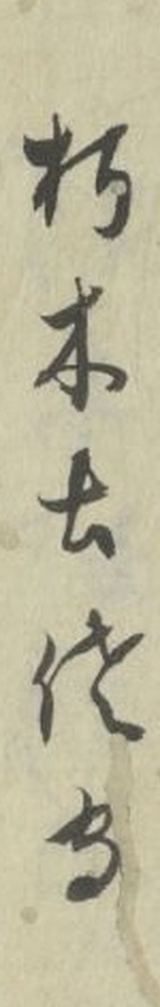同断朽木土佐守
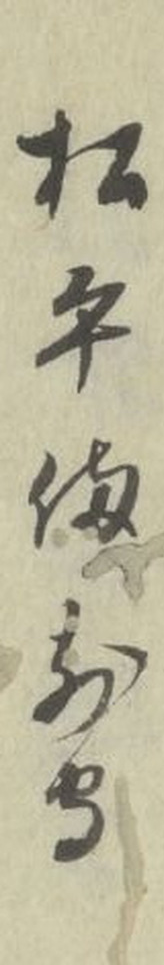同断松平備前守
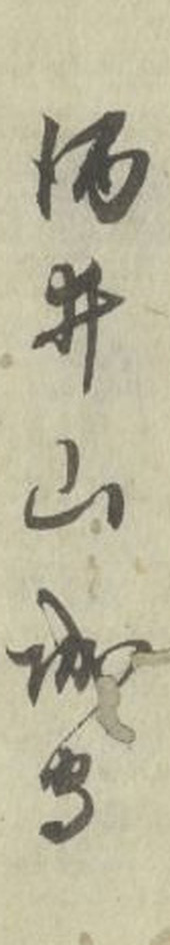同断酒井山城守

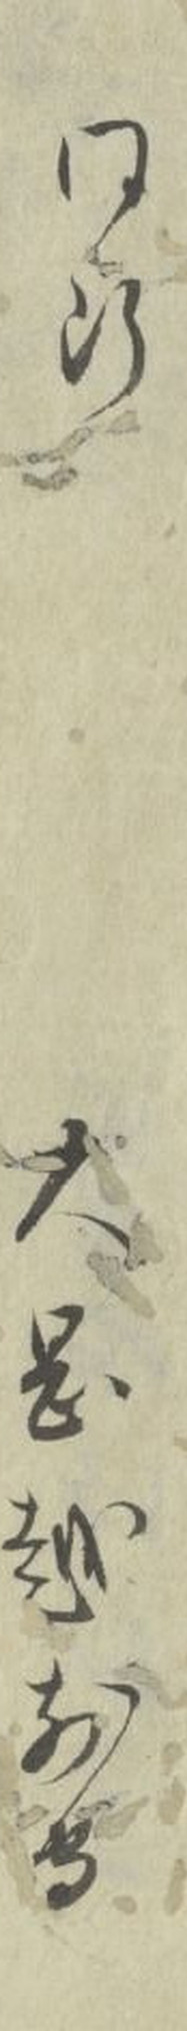同断大岡越前守
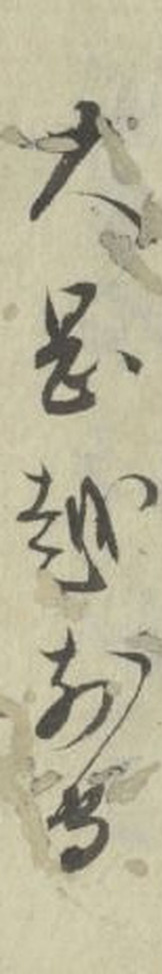同断大岡越前守
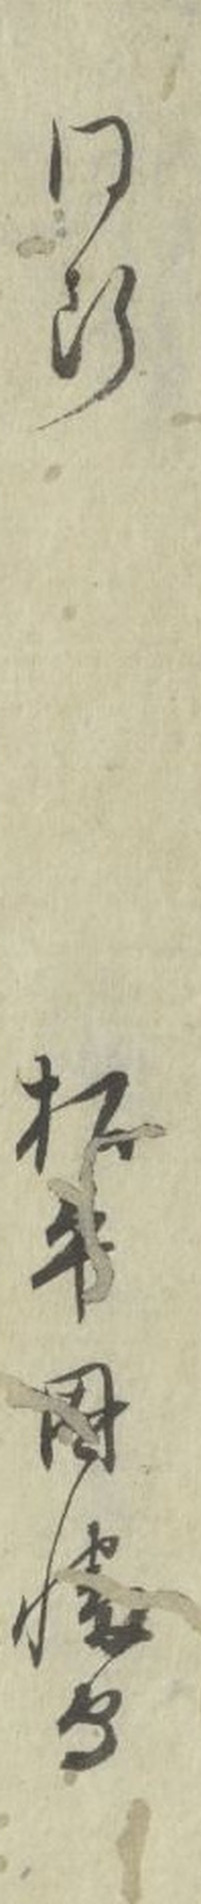同断松平因幡守
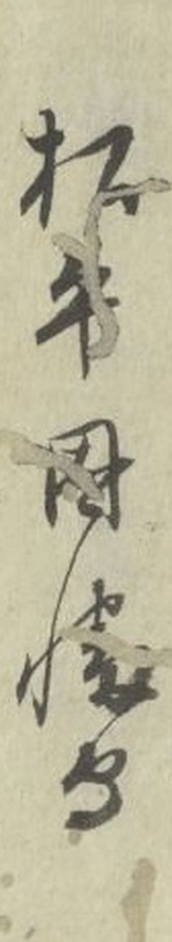同断松平因幡守
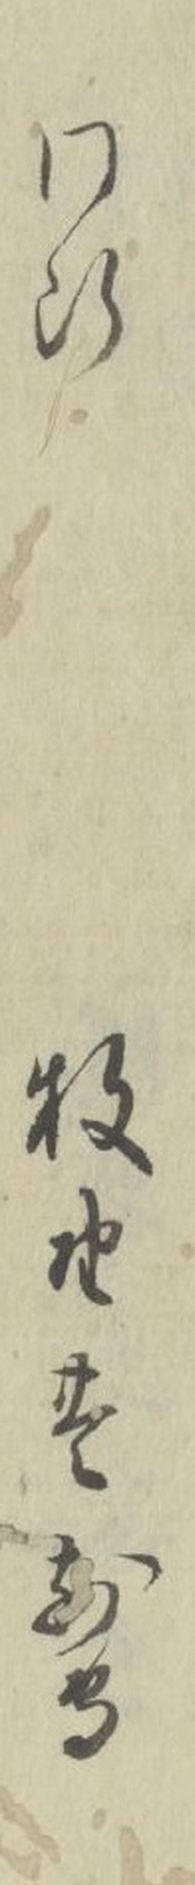同断牧野豊前守
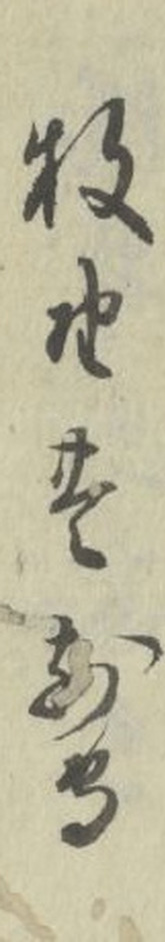同断牧野豊前守
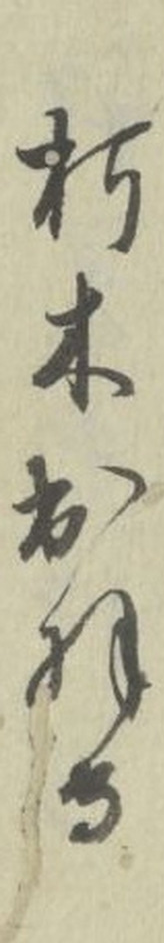同断朽木出羽守
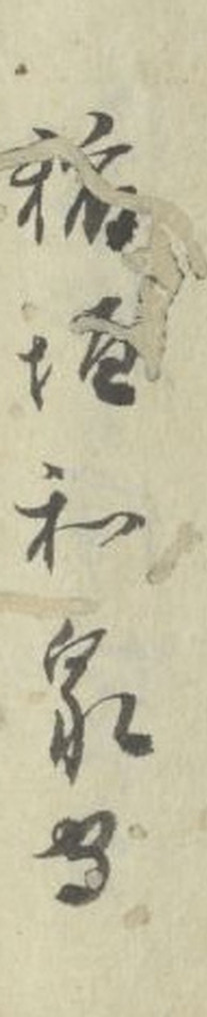同断稲垣和泉守
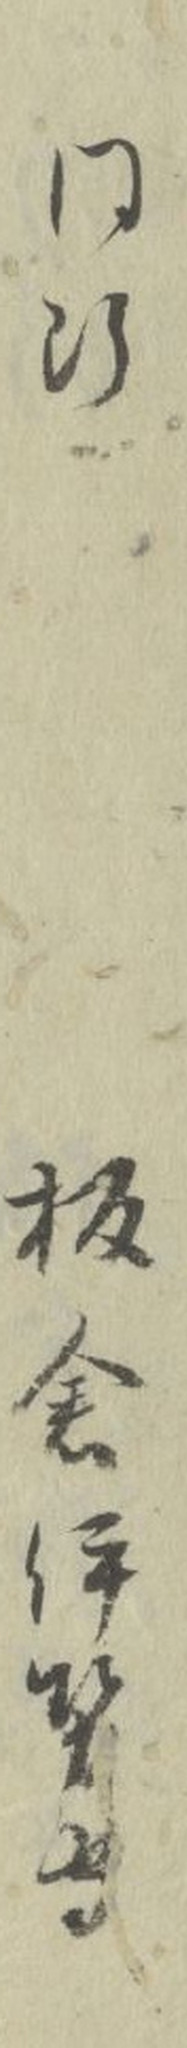同断板倉伊賀守
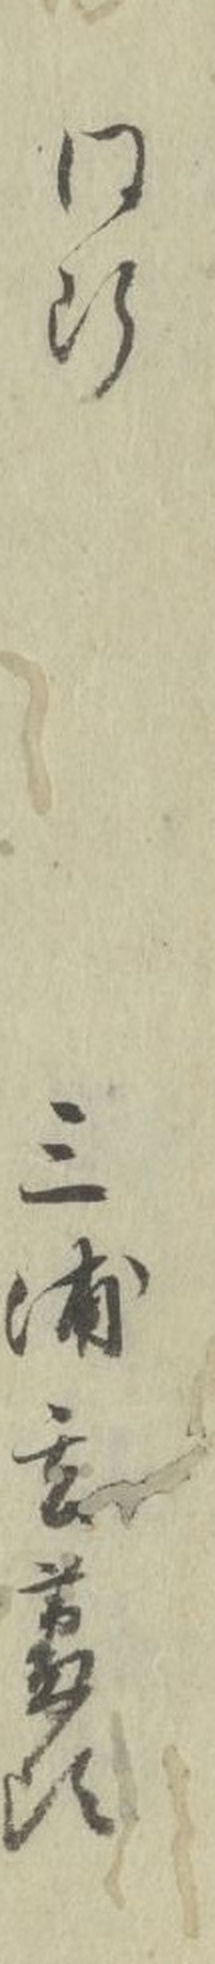同断三浦玄蕃頭
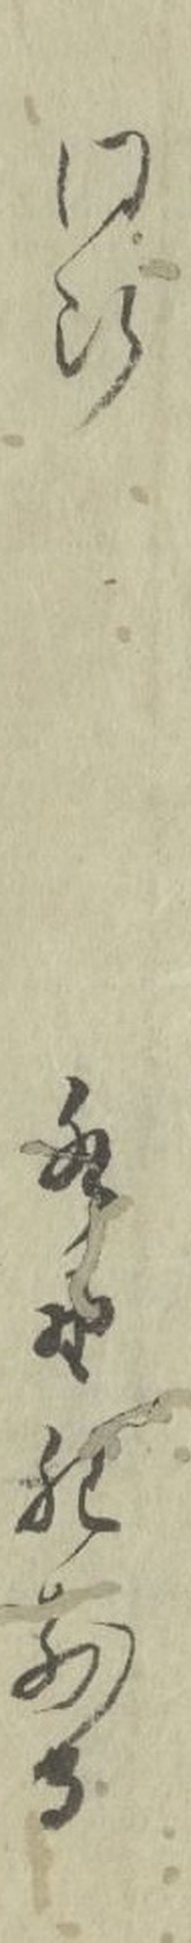同断水野肥前守
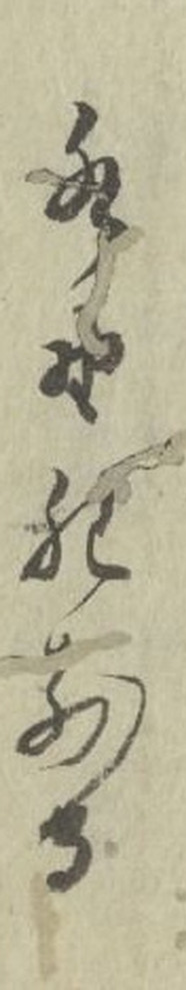同断水野肥前守
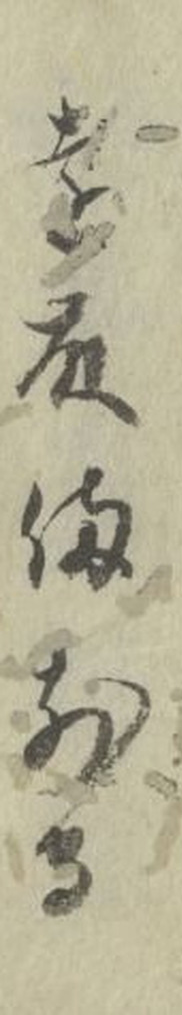同断遠藤備前守
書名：琉球来朝記 自一至七
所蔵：University of the Ryukyus Library
